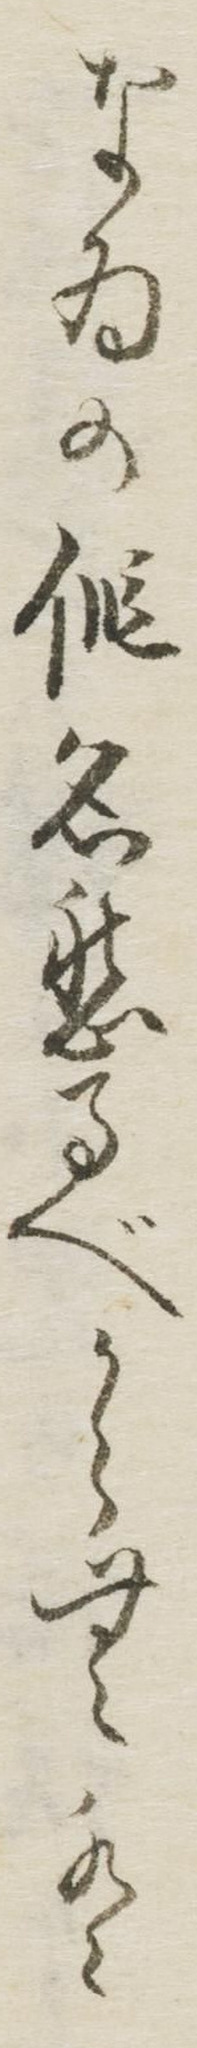なゐの仮名然るべから無と
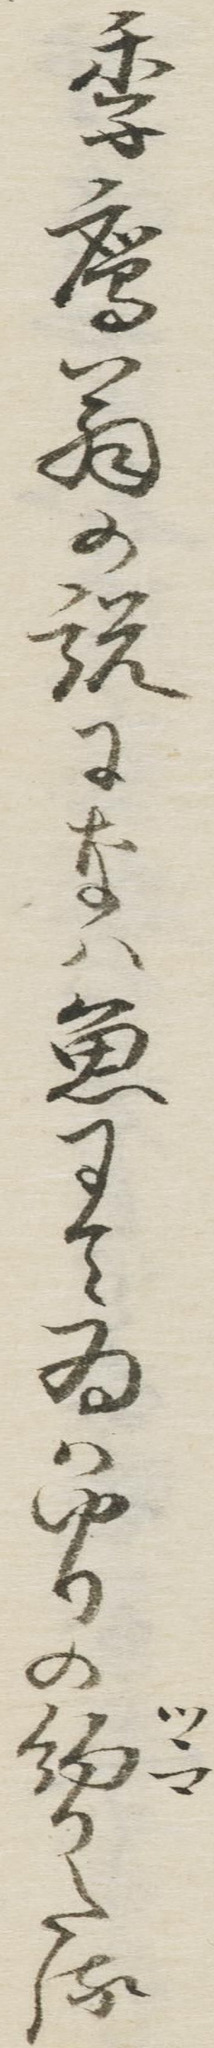季鷹翁の説になハ魚にてゐハゆりの約りたる
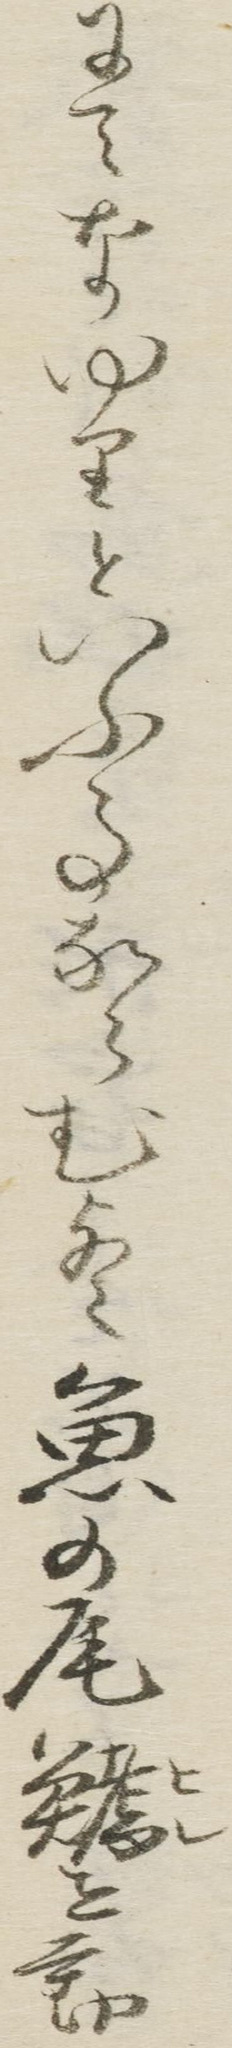にてなゆりといふ事ならむ歟魚の尾鰭を動

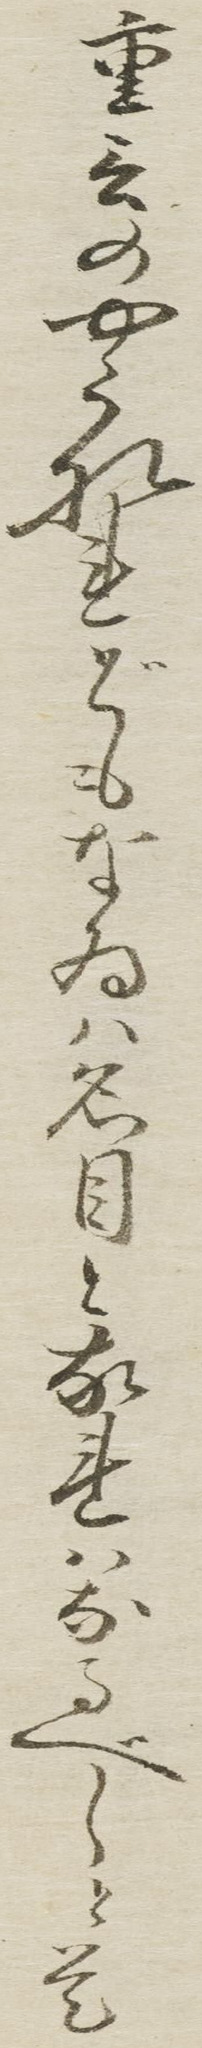重言のやうなれどもなゐは名目となれはなるべしと是
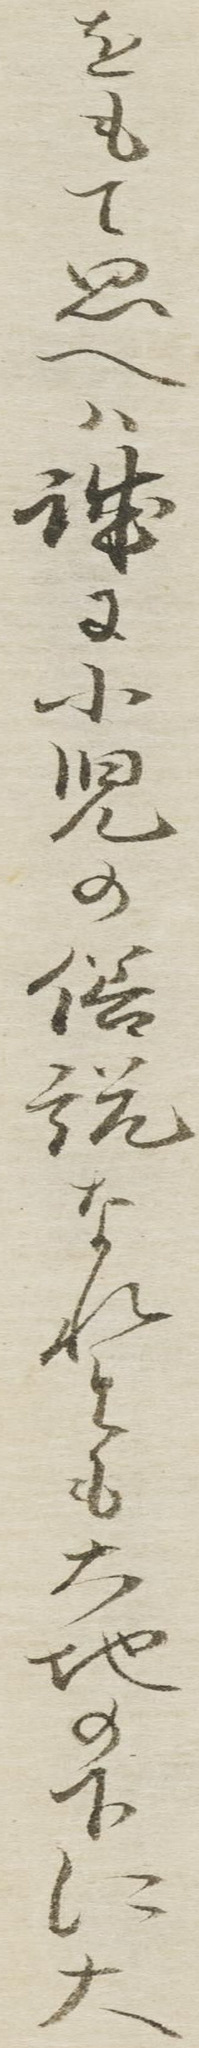をもて思へは誠に小児の俗説なれとも大地の下に大
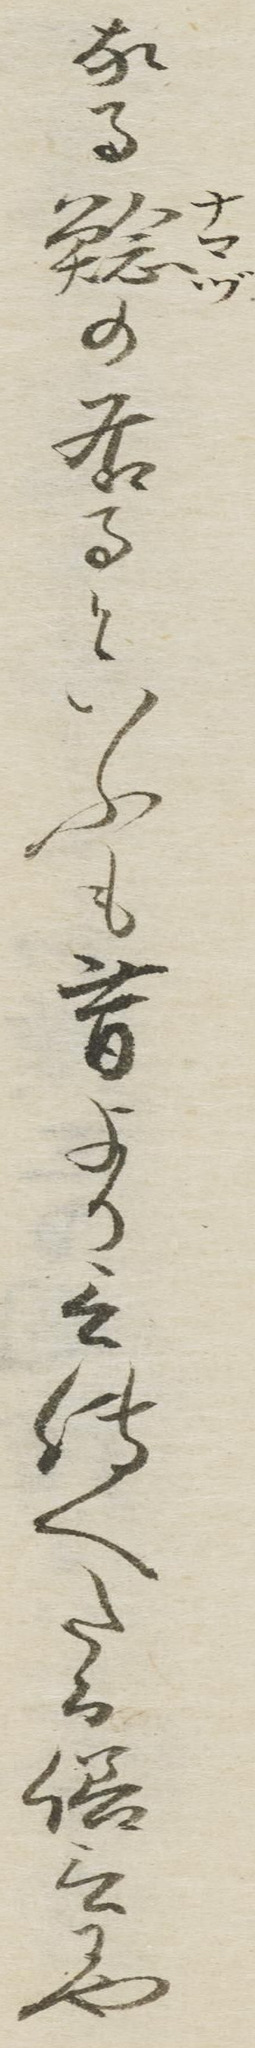なる鯰の居るといふも昔より言伝へたる俗言にや
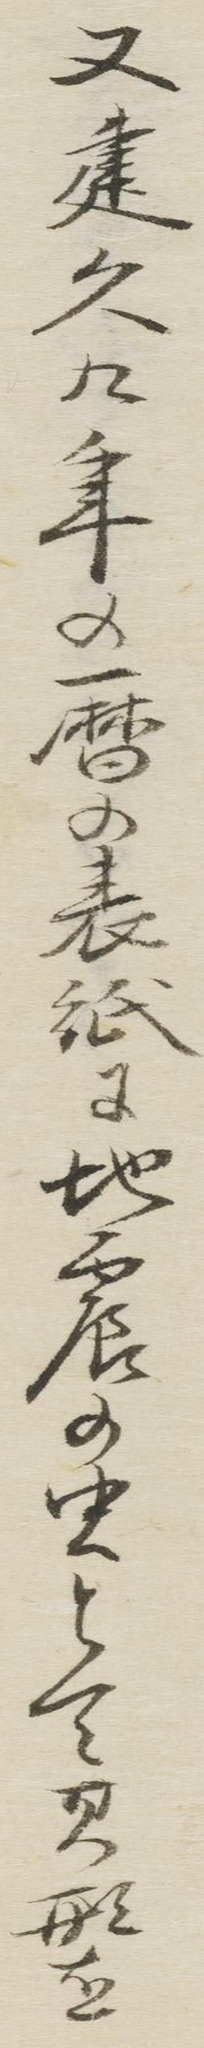又建久九年の暦の表紙に地震の虫とて其形を
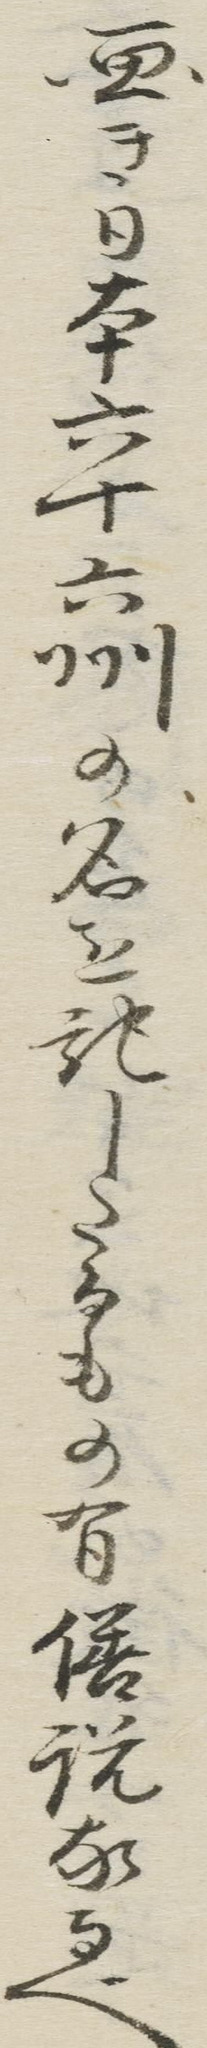画き日本六十六州の名を記したるもの有俗説なるべ
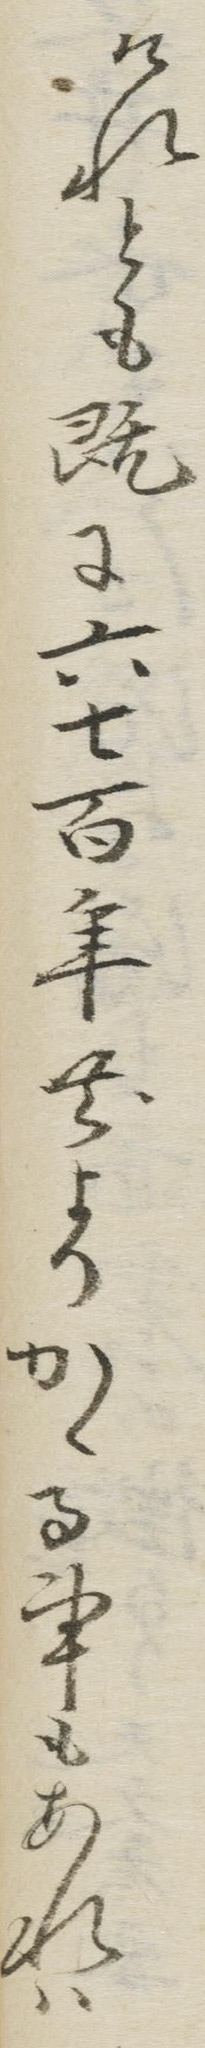けれとも既に六七百年前よりかゝる事もあれは
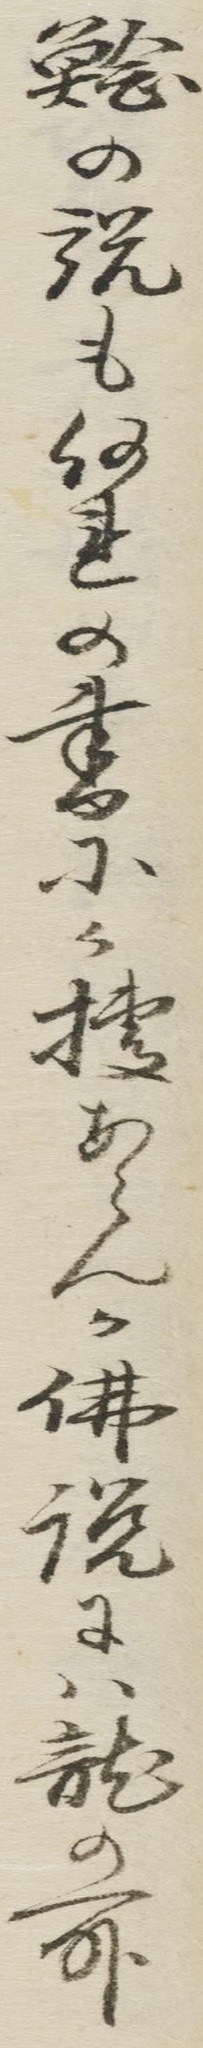鯰の説も何れの書にか拠あらんか仏説には龍の所
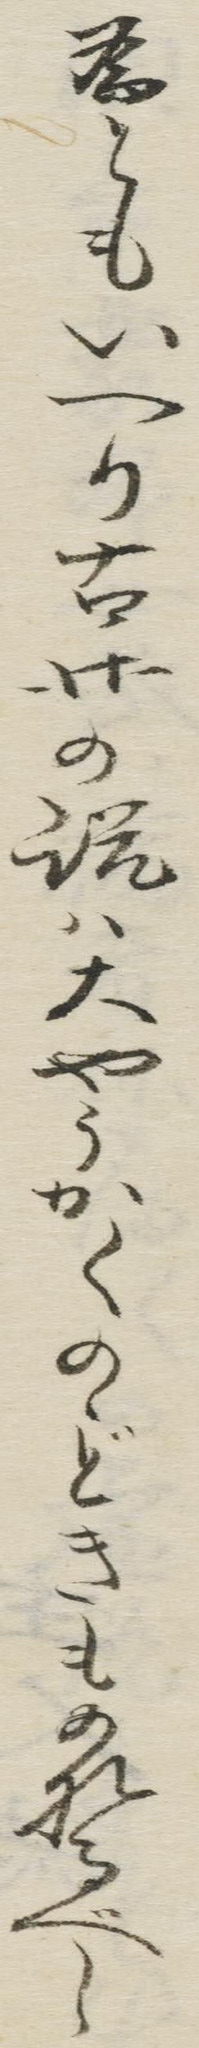為ともいへり古代の説は大やうかくのごときものなるべし
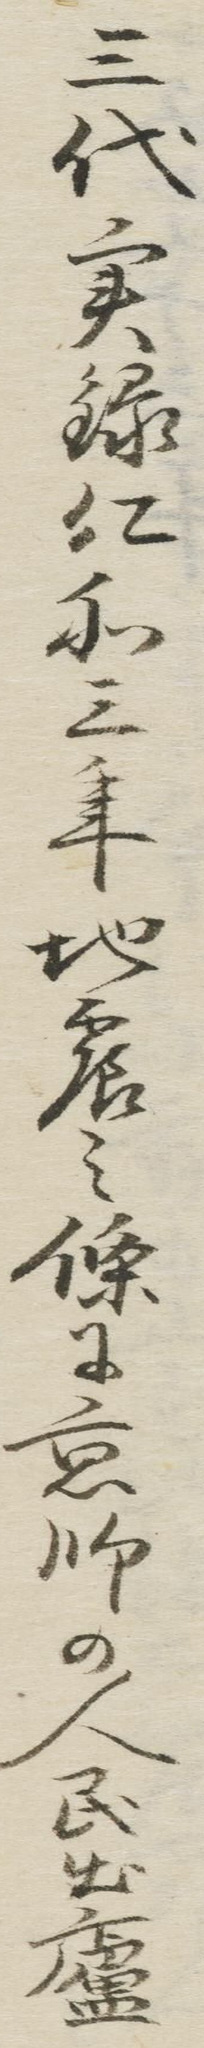三代実録仁和三年地震の条に京師の人民出蘆
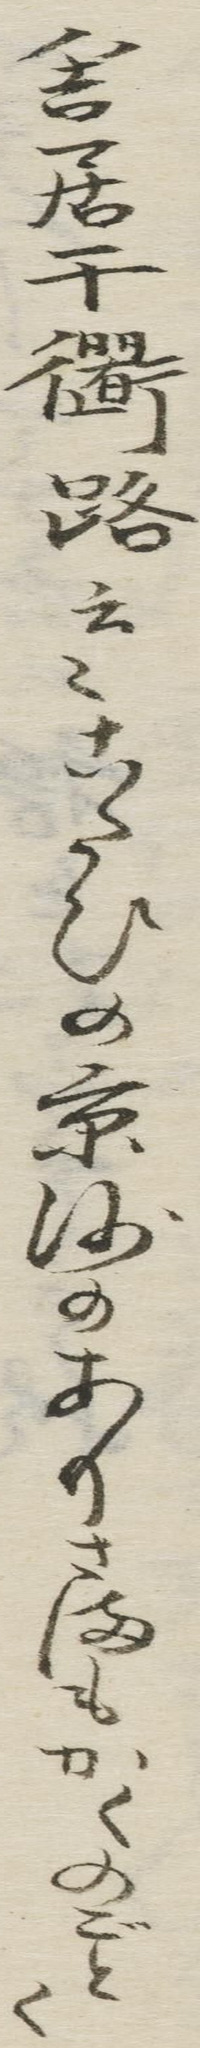舎居于衢路云々こたひの京沙のありさまもかくのごとく
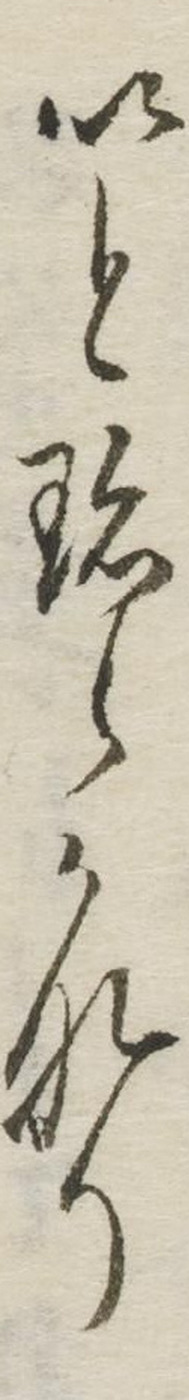いと珍らかなり
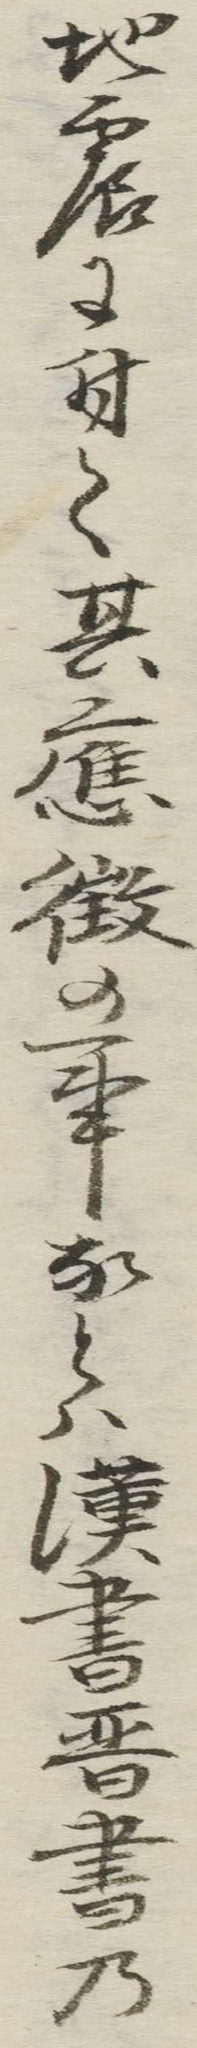地震に付て其応徴の事なとは漢書晋書の
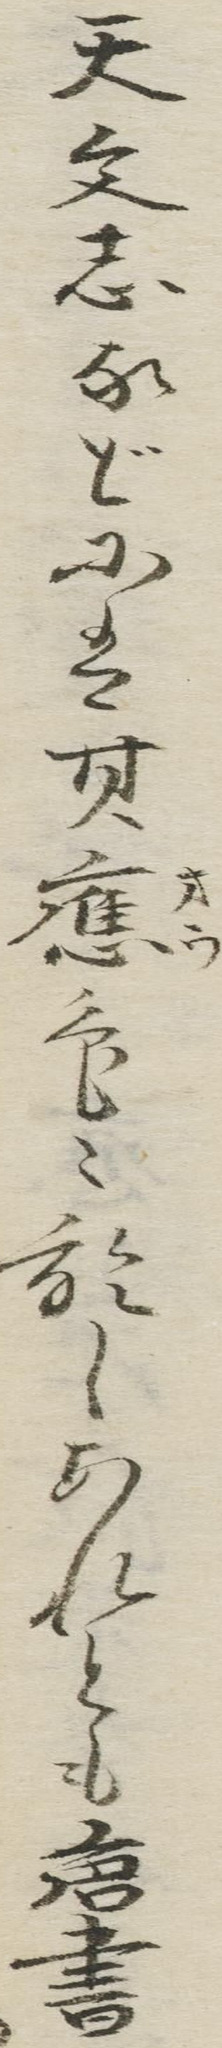天文志などには其応色々記しあれとも唐書の
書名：諸国大地震大津波一代記
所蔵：東京大学地震研究所図書室 Earthquake Research Institute Library, The University of Tokyo, JAPAN
